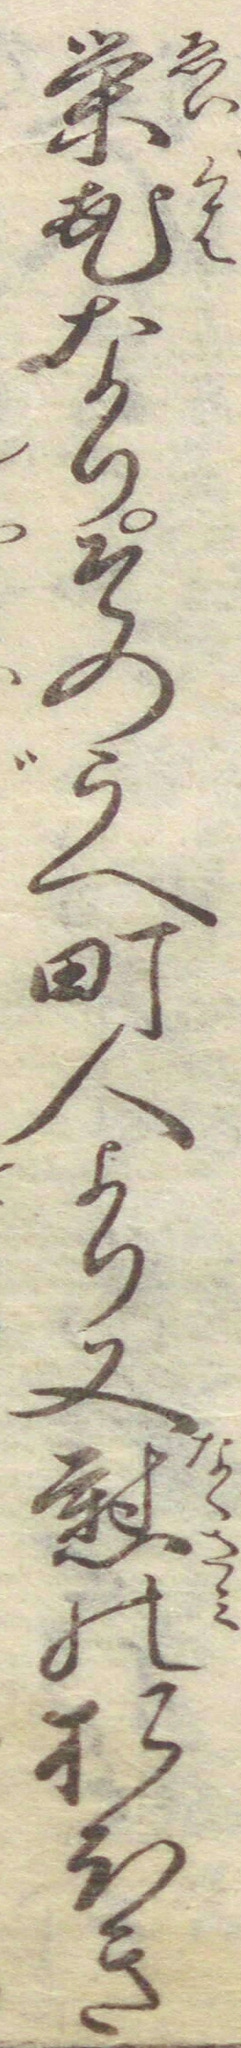栄花なり。そのうへ町人より又慰のおほき
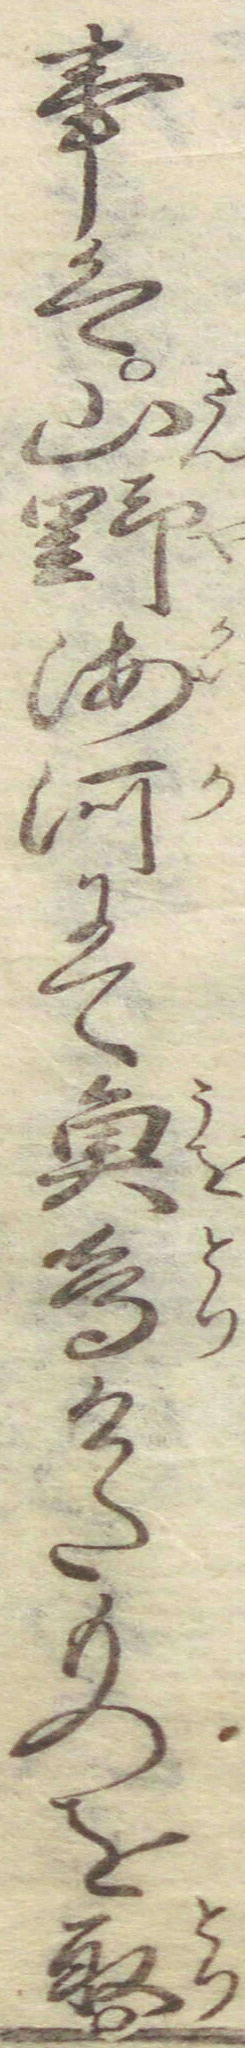事は。山野海河にて魚鳥けたものを取。
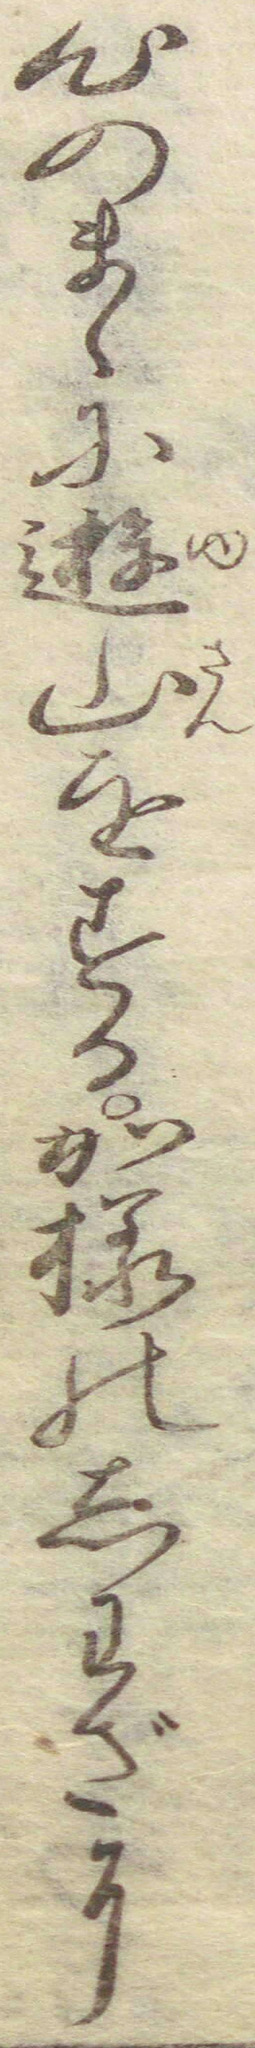心のまゝに遊山をする。加様のしわざに
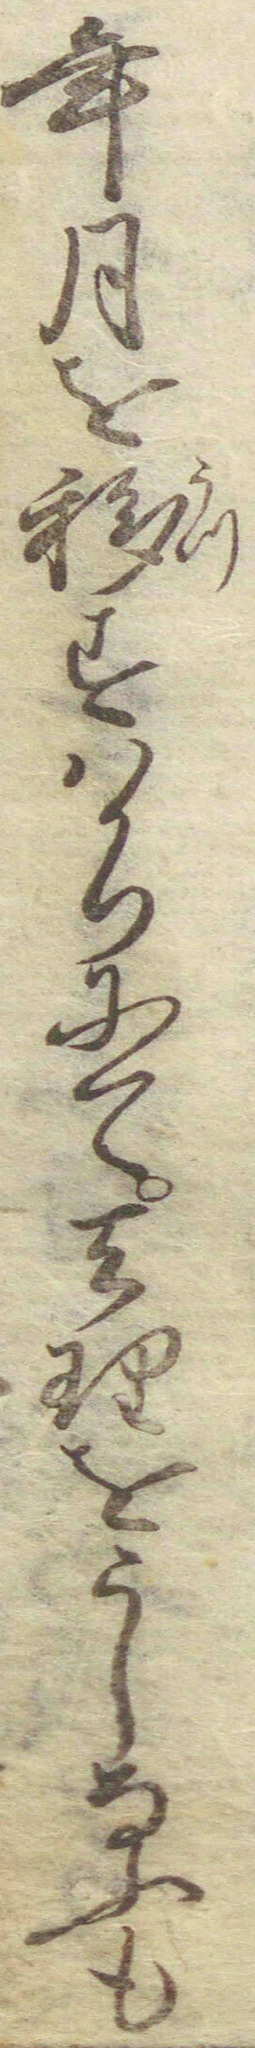年月を移すはかりにて。天理をうしなふも

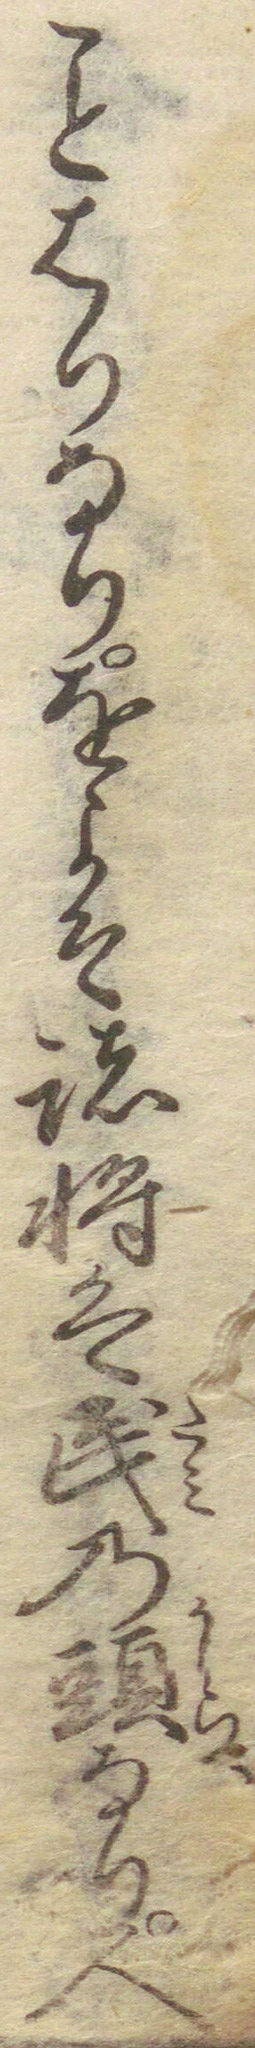ことはりなり。をよそ諸将は民の頭なり。人
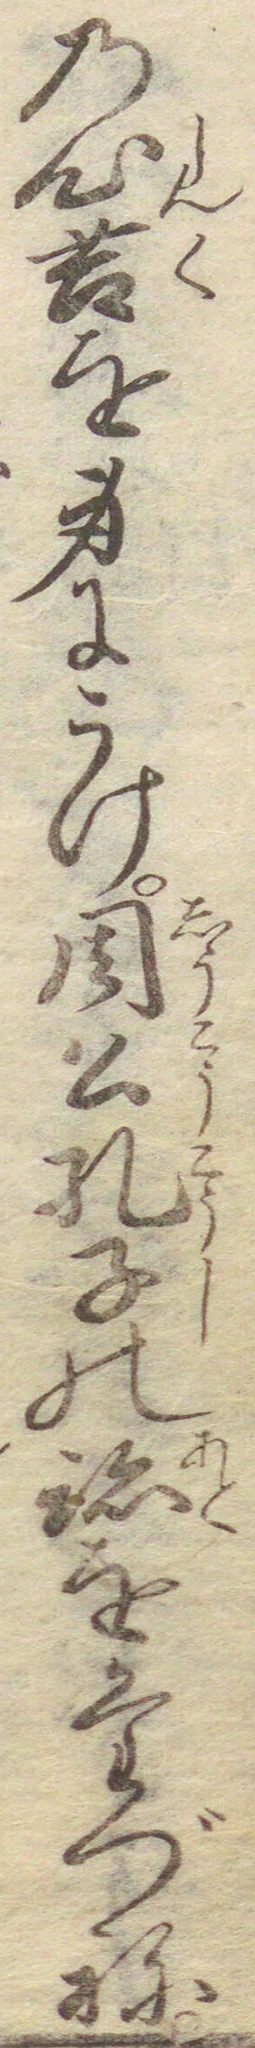の心苦を身にうけ。周公孔子の跡をたづね
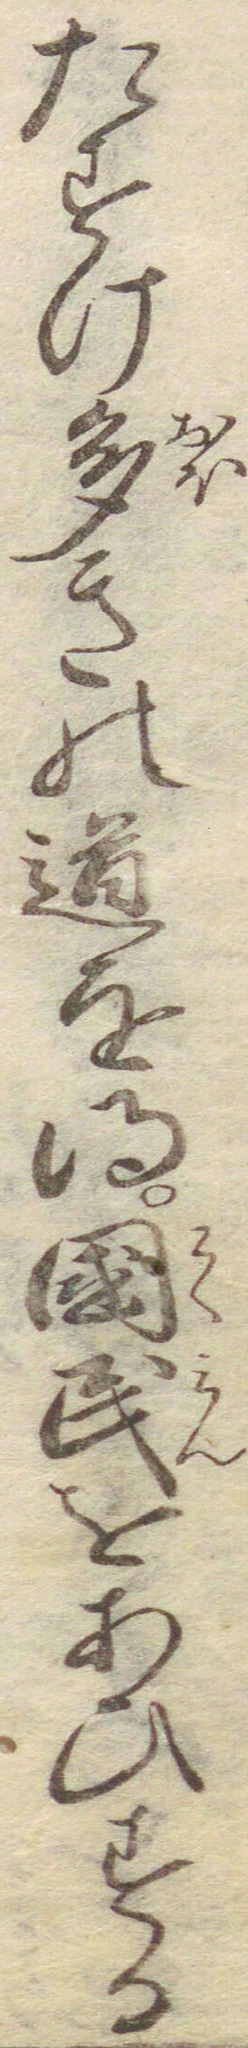たすけ多きの道を得。国民をあひする
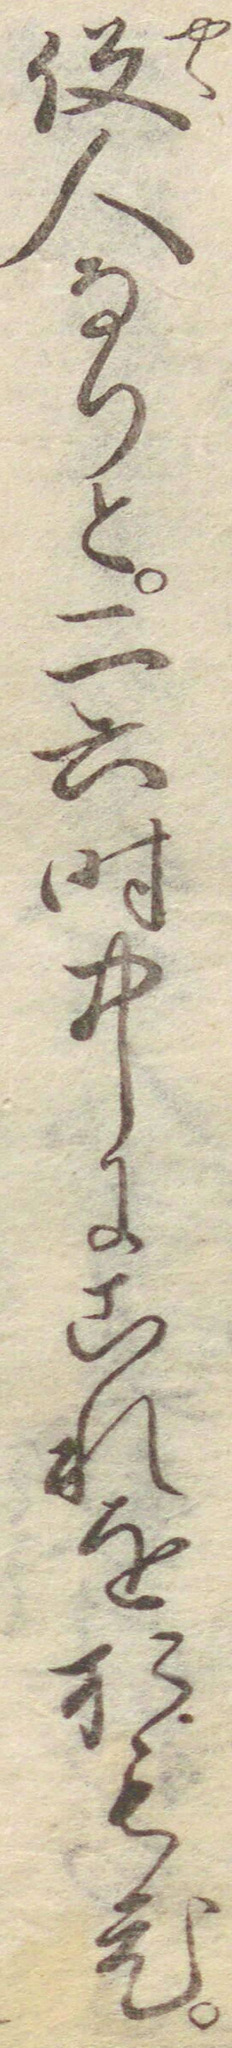役人なりと。二六時中にこれをおもひ。
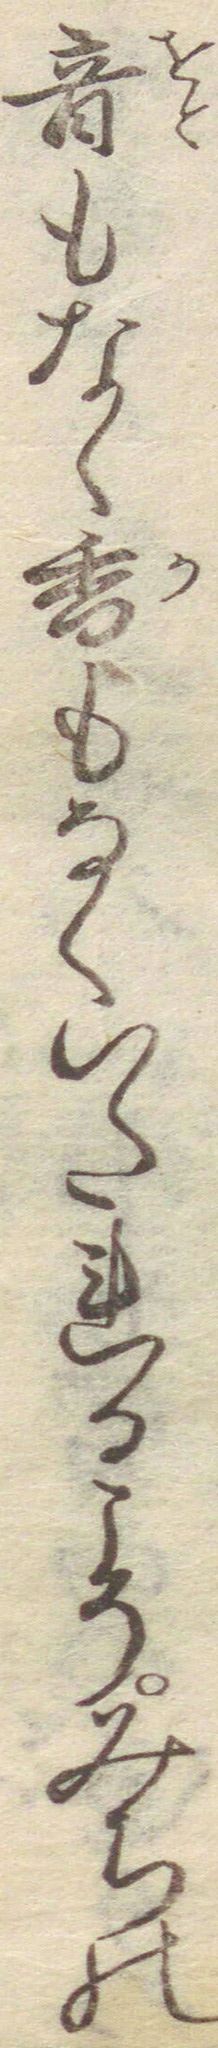音もなく香もなくいたれるこそ。みちの
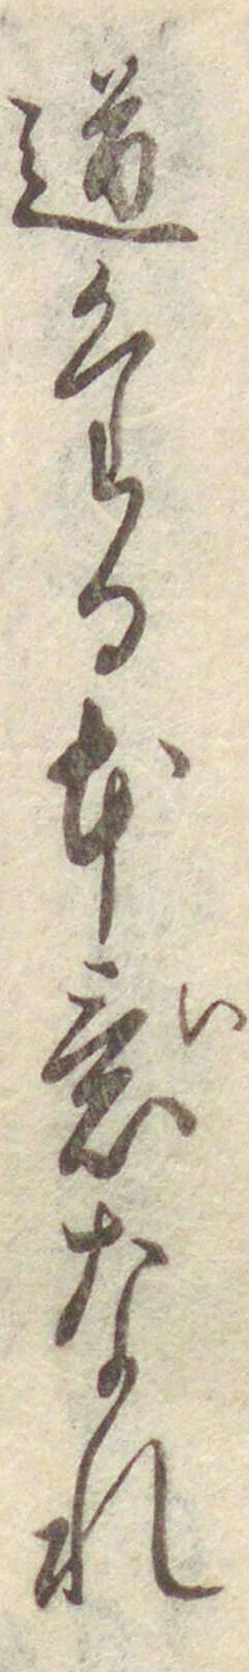道たる本意なれ
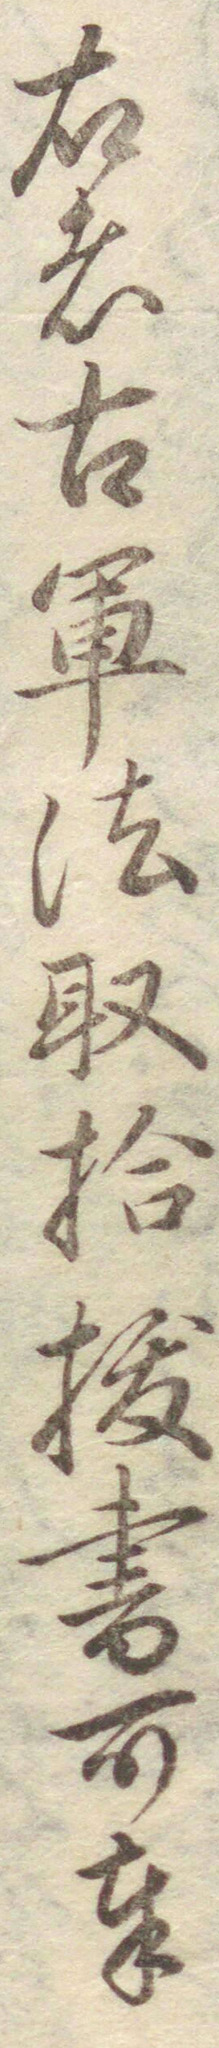右は古軍法取捨抜書可奉
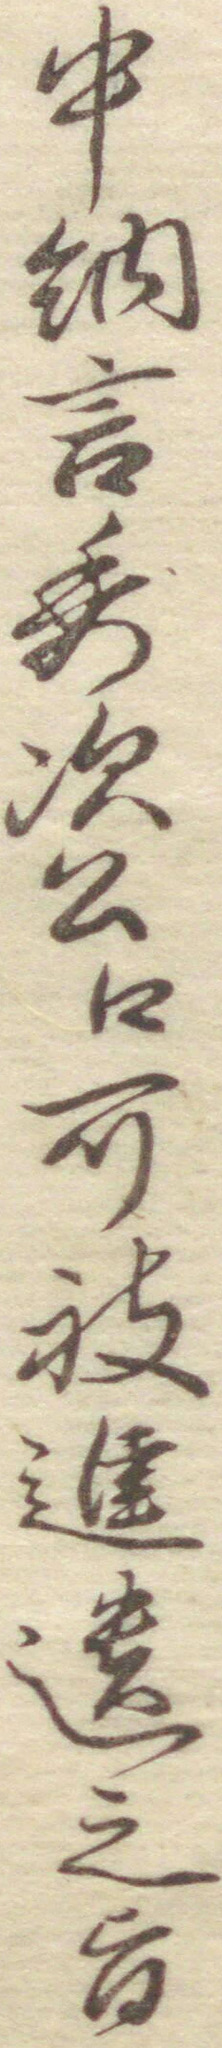中納言秀次公江可被進遺之旨
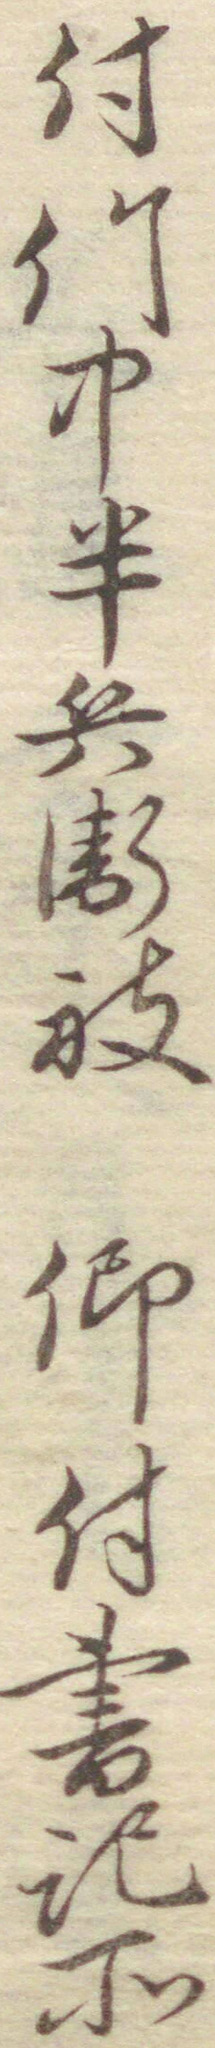付竹中半兵衛被仰付書記所
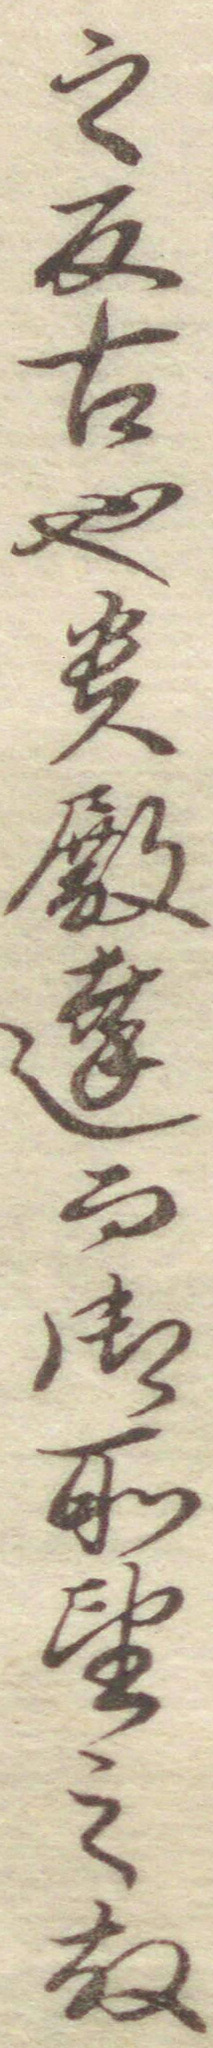之反古也貴殿達而御所望之故
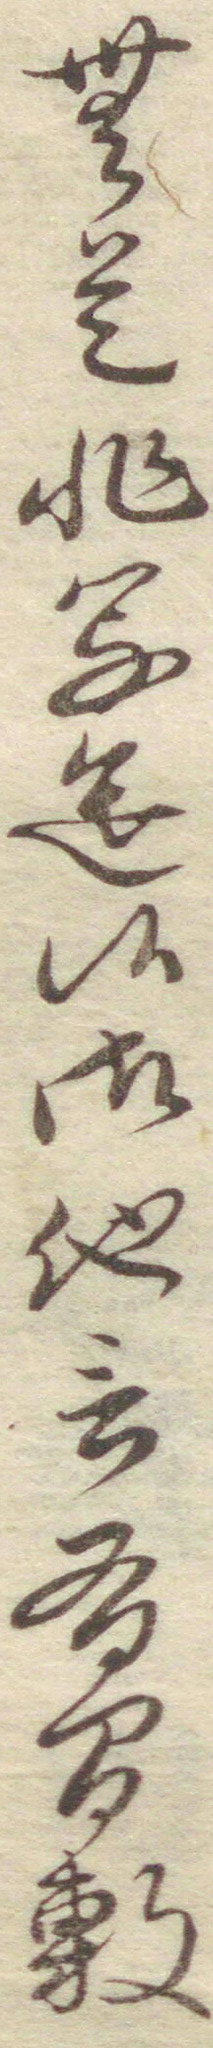無是非写遣候御他言有間敷
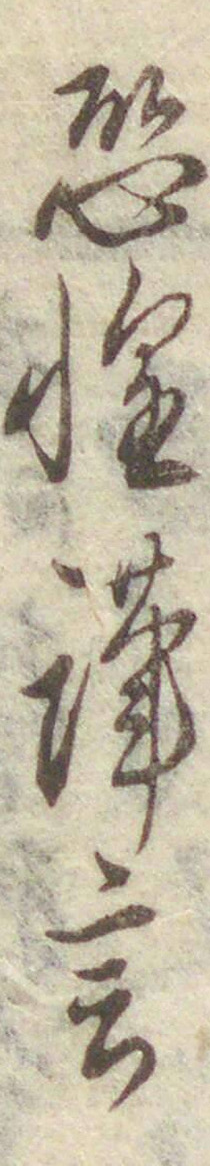恐惶謹言
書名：軍法極秘傳書
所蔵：国文学研究資料館
